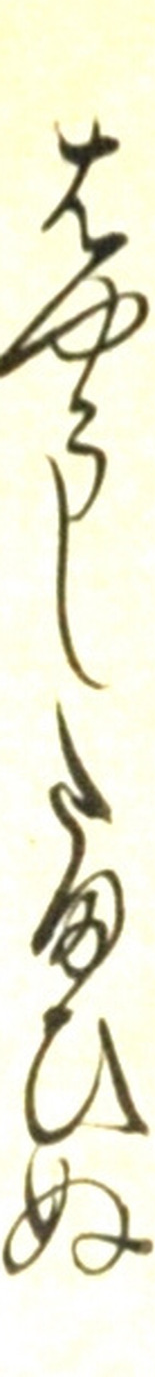はやうしたまひぬ
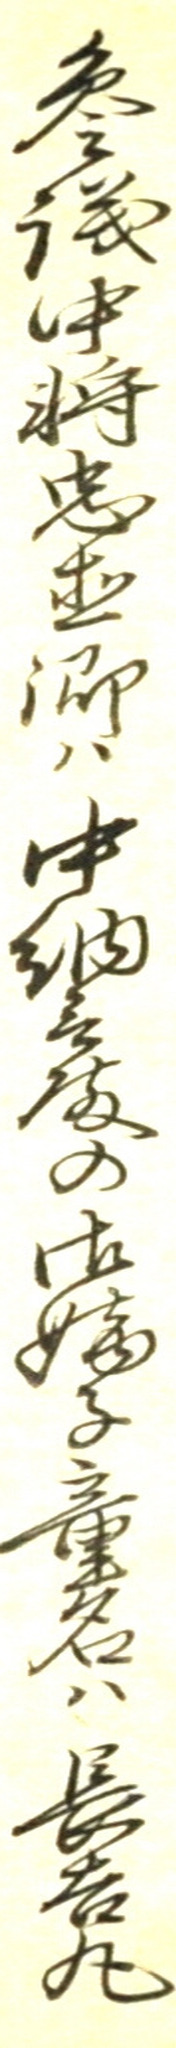参議中将忠直卿は中納言殿の御嫡子童名は長吉丸
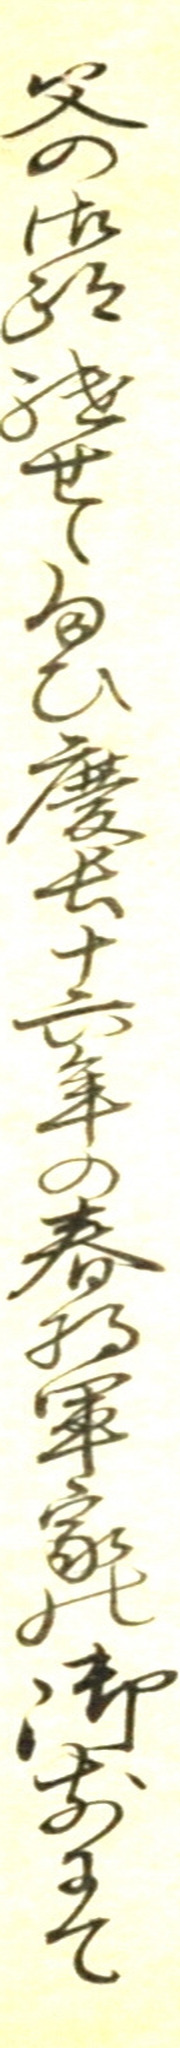父の御跡継せたまひ慶長十六年の春将軍家の御前にて
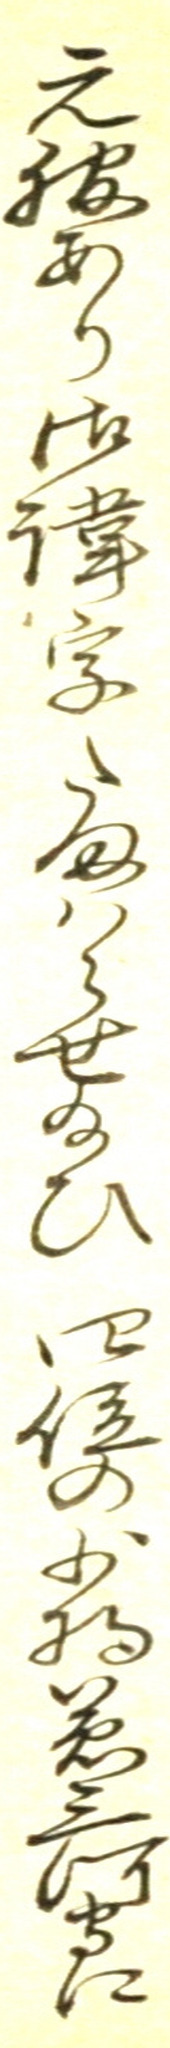元服あり御諱字たまはらせ給ひ四位の少将兼三河守に
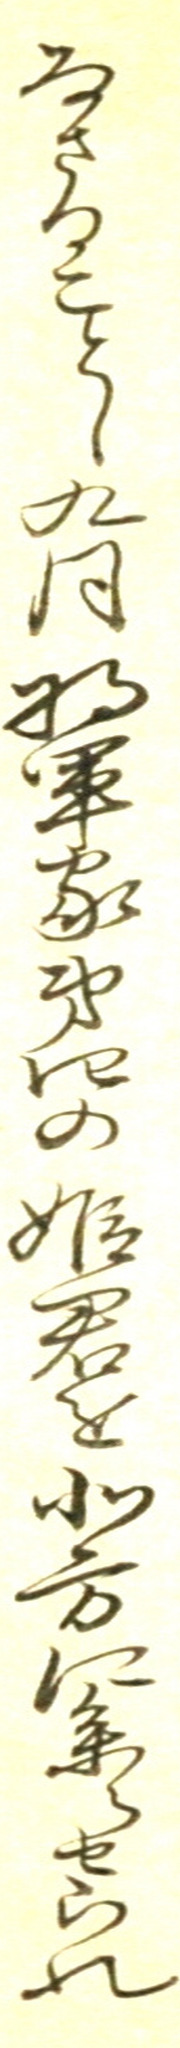なさることし九月将軍家第四の姫君を北方に参らせられ
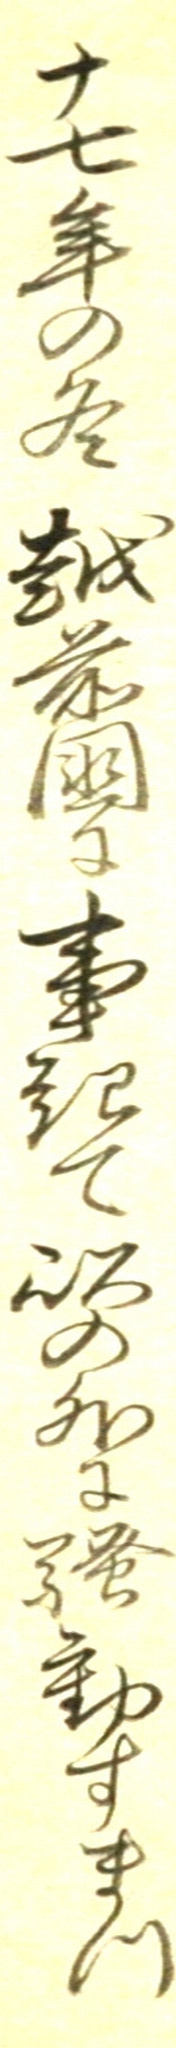十七年の冬越前国に事起て以の外に騒動すまつ
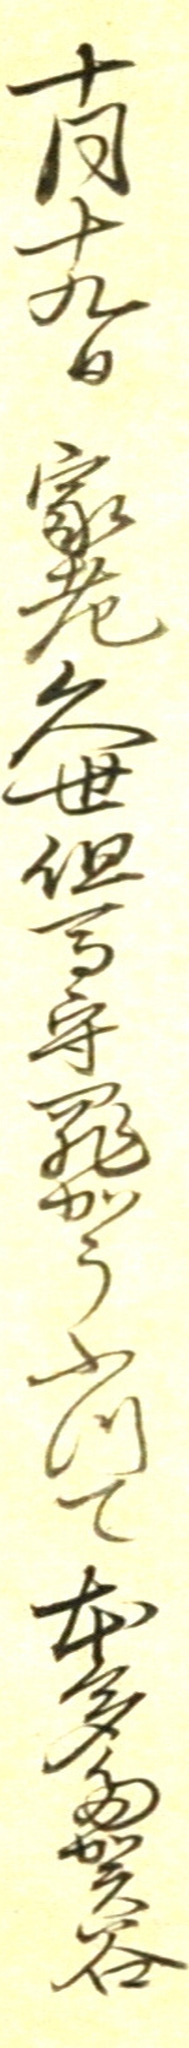十月十九日家老久世但馬守罪かうふつて本多多賀谷
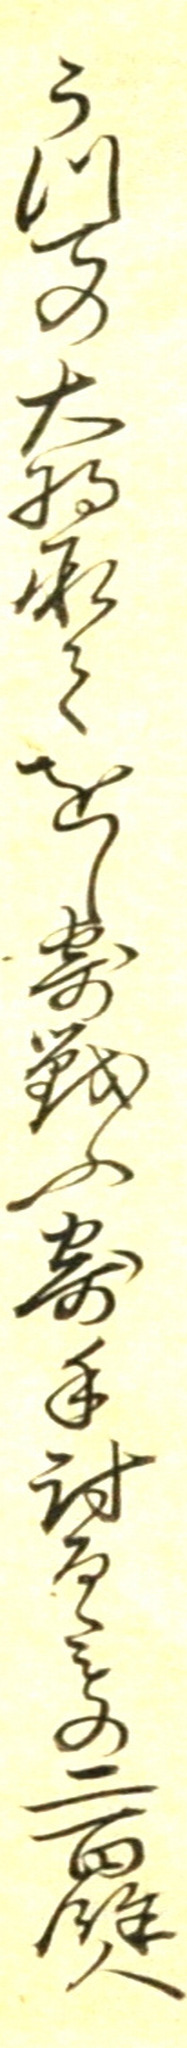うつての大将承てをし寄戦ふ寄手討るゝもの二百余人
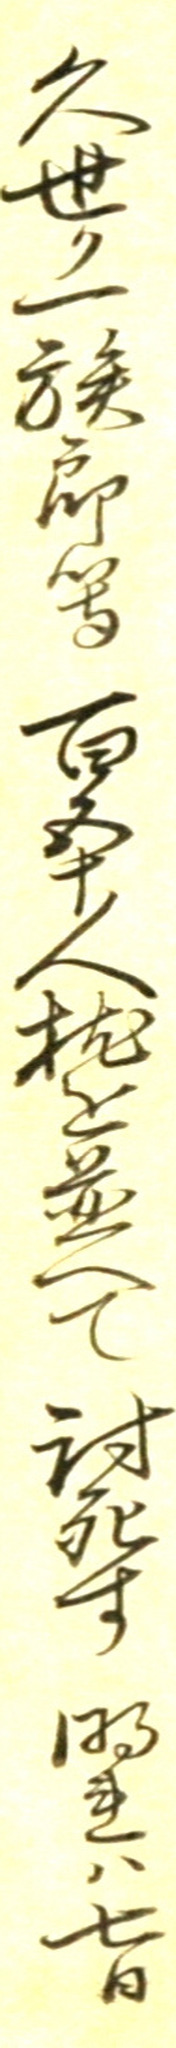久世か一族郎等百五十人枕を並へて討死す明れは七日

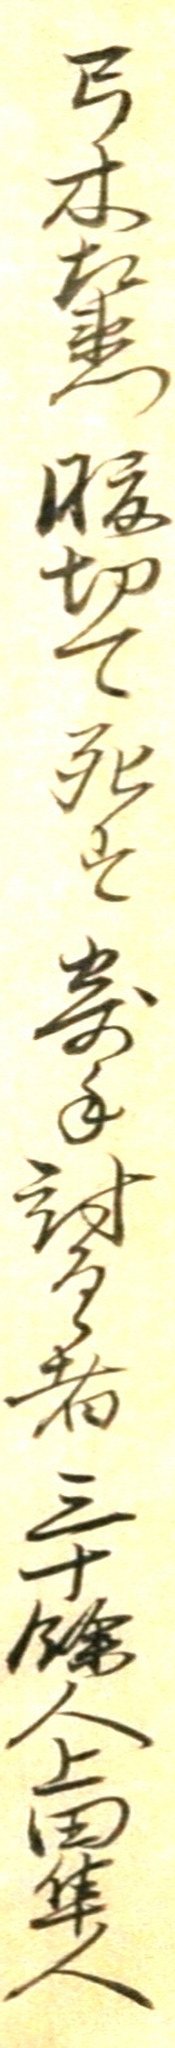弓木左衛門腹切て死す寄手討るゝ者三十余人上田隼人
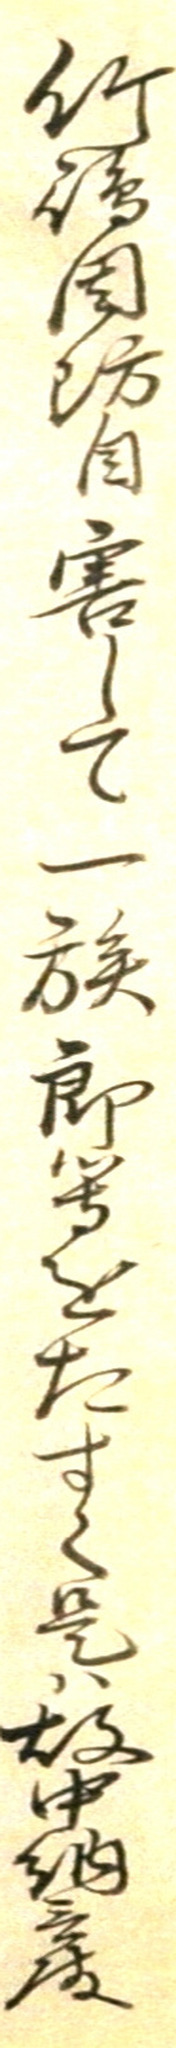竹島周防自害して一族郎等をたすく是は故中納言殿
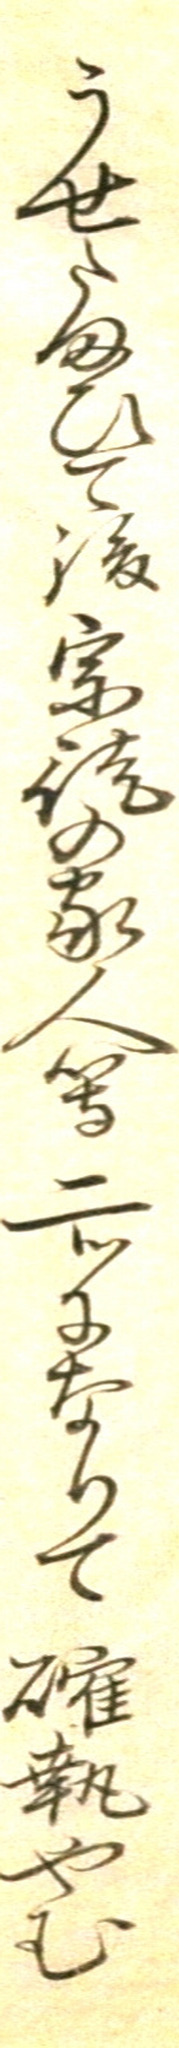うせたまひて後宗徒の家人等二ッになりて確執やむ
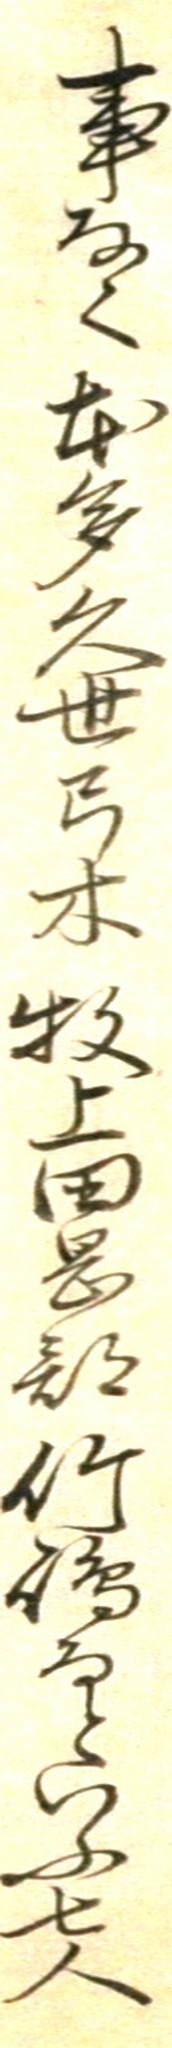事なく本多久世弓木牧上田岡部竹島なといふ七人
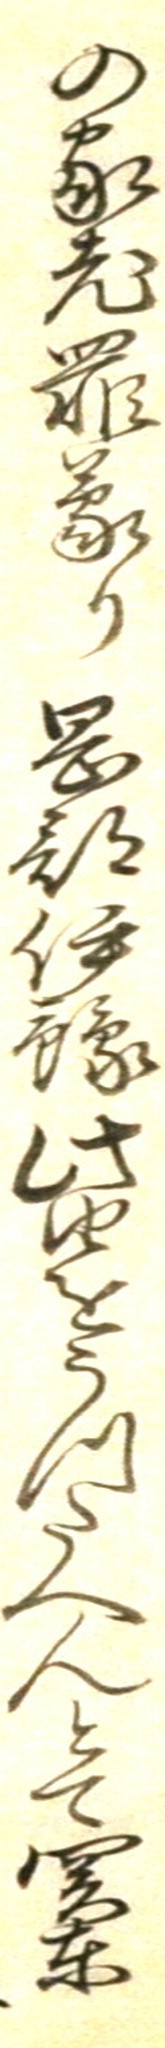の家老罪蒙り岡部伊予此由をうつたへんとて関東に
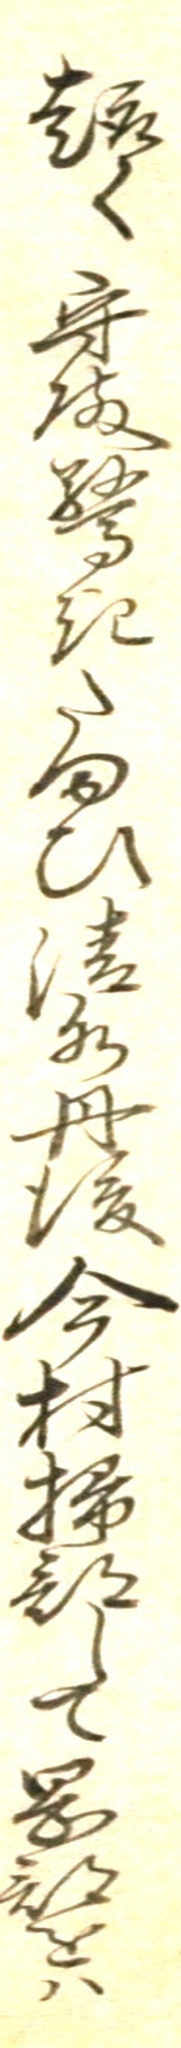趣く守殿驚きたまひ清水丹後今村掃部して岡部をは
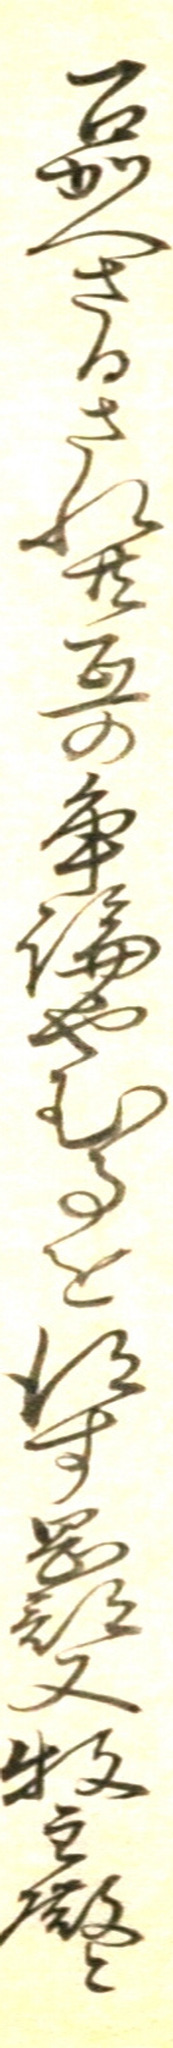召かへさるされ共互の争論やむ事を得す岡部又牧主殿と
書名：藩翰譜（一）
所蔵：伊那市立高遠町図書館・合同会社AMANE
